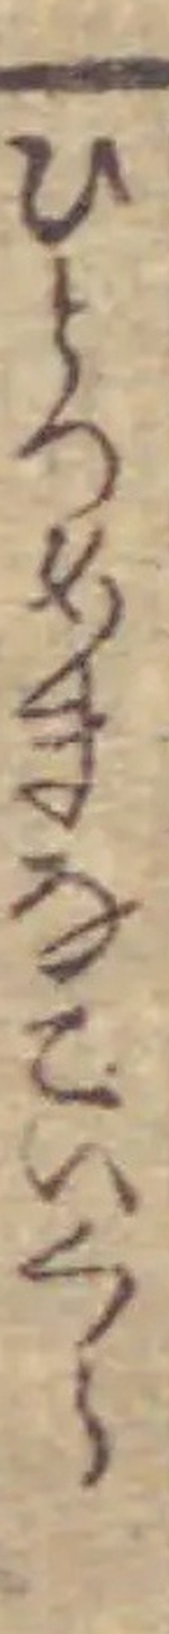ひとつめまなこいくら
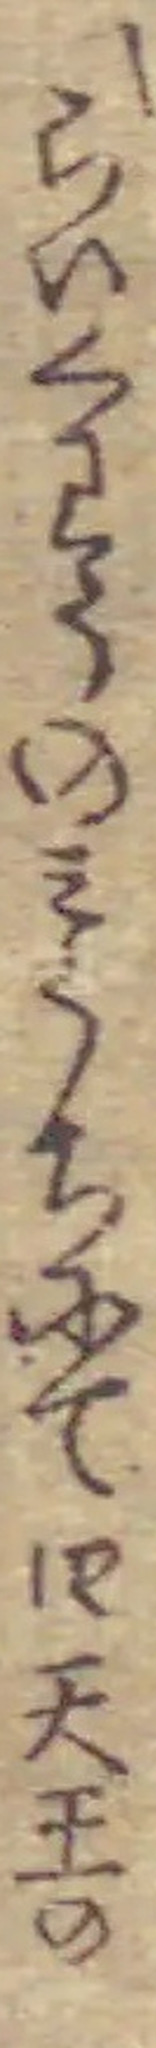〽らいくわうのみうちにては天王の
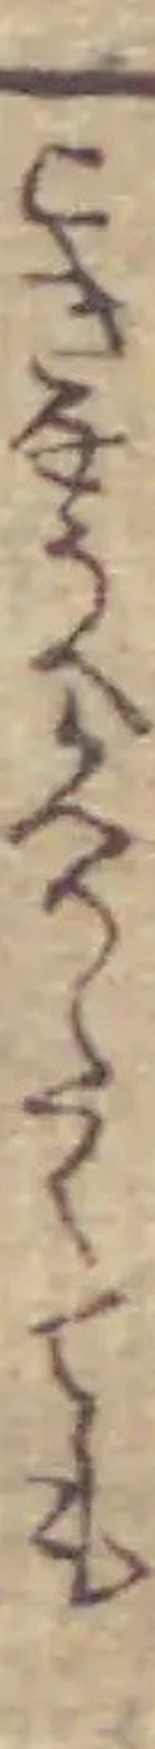こきやうへかへりたくても
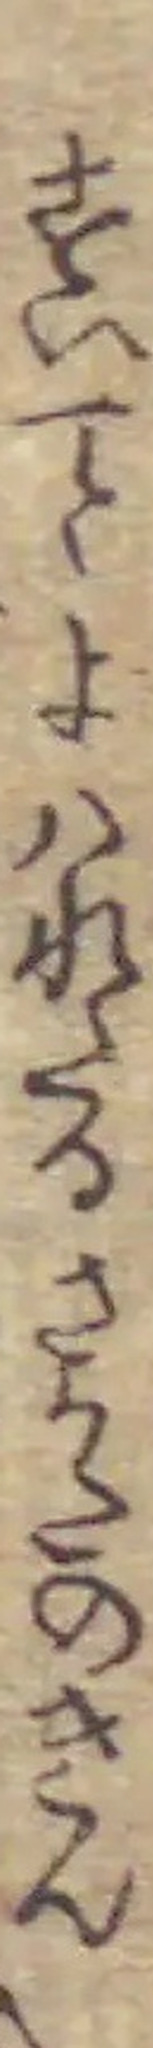すい一とよはれたるさかたのきん
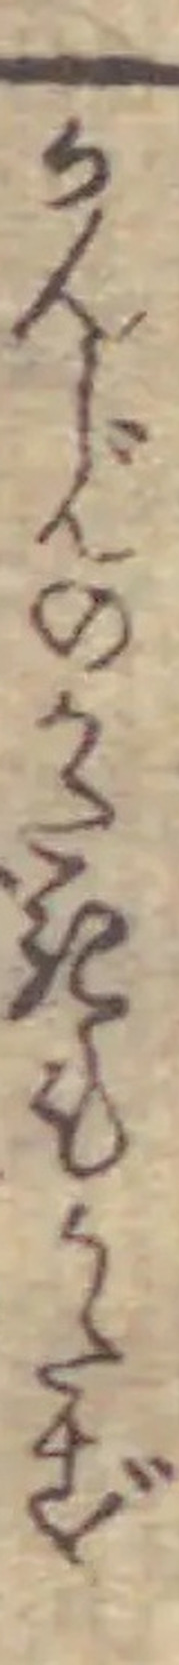かんじんのかたきもうたず
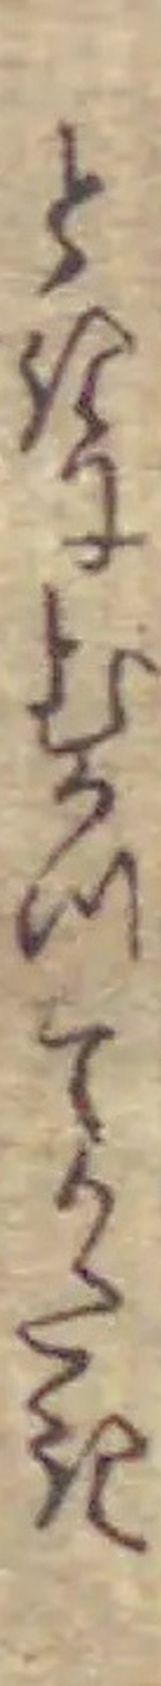ときにむかつてかたき
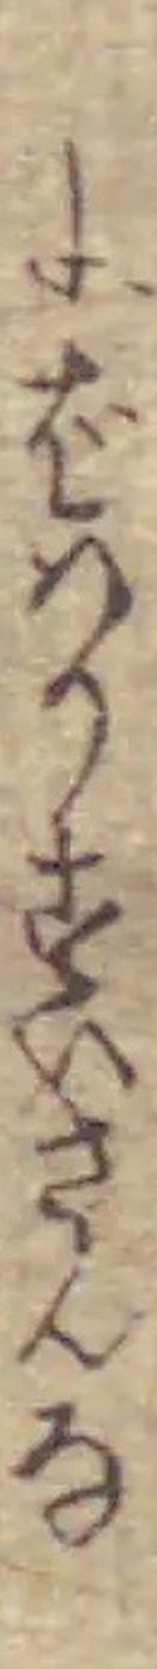よばはりすいさんな
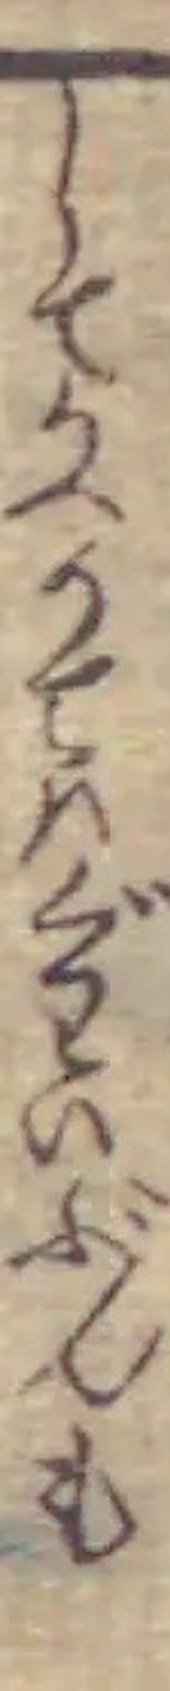してかへりてはぐわいぶんも
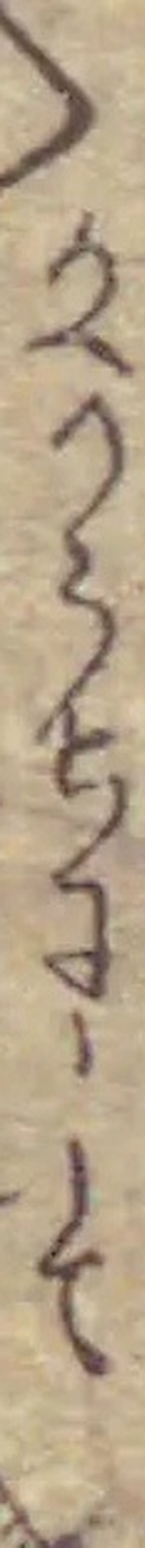かへりうちにして
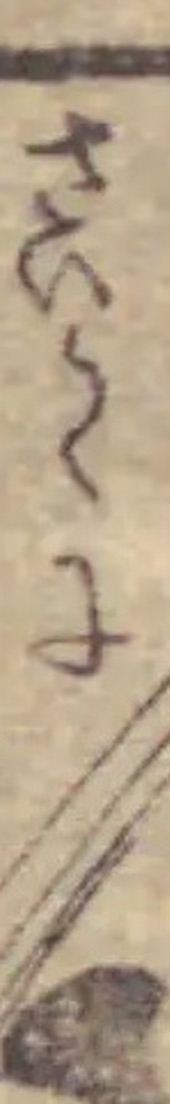さいかくに
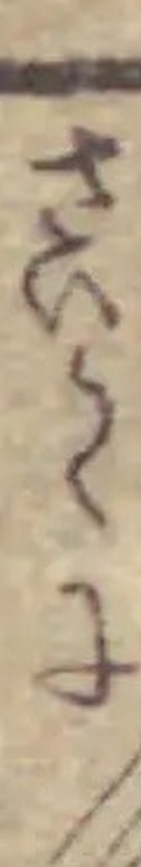さいかくに
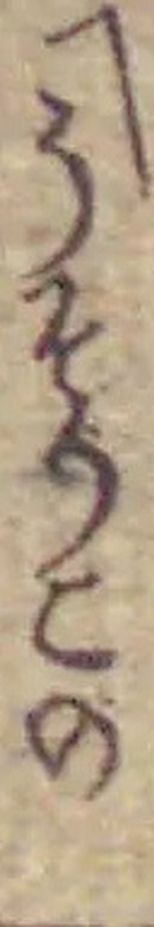〽うそかこの
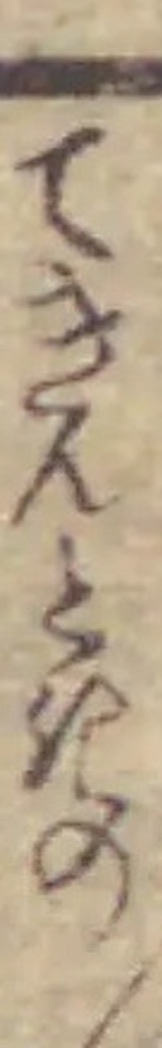てきんときの
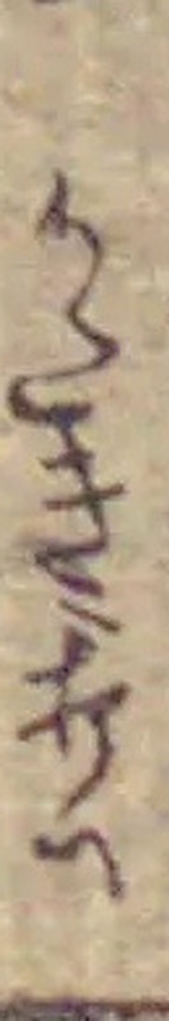かたき打は
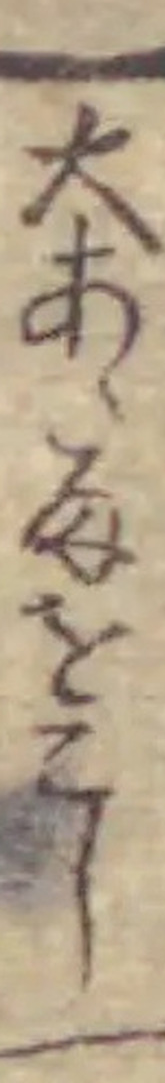大あたまをこし
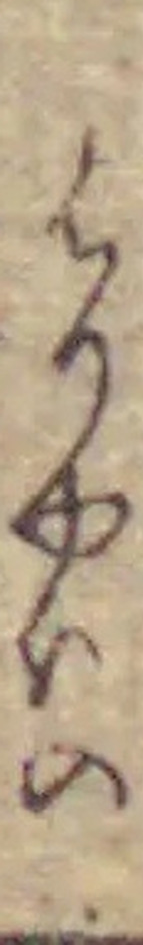はりやいの
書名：化物敵討 2巻
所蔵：国立国会図書館 National Diet Library, JAPAN
